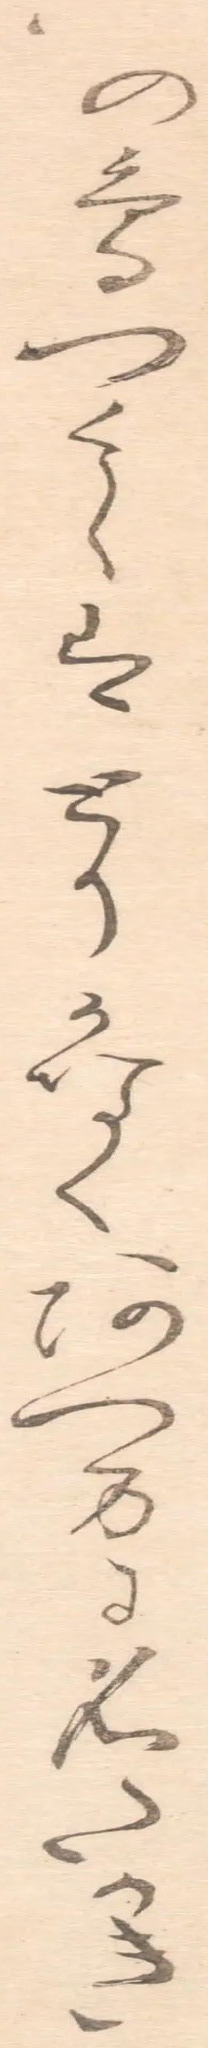この鳥つくしはとりかなくあつまに名たかき
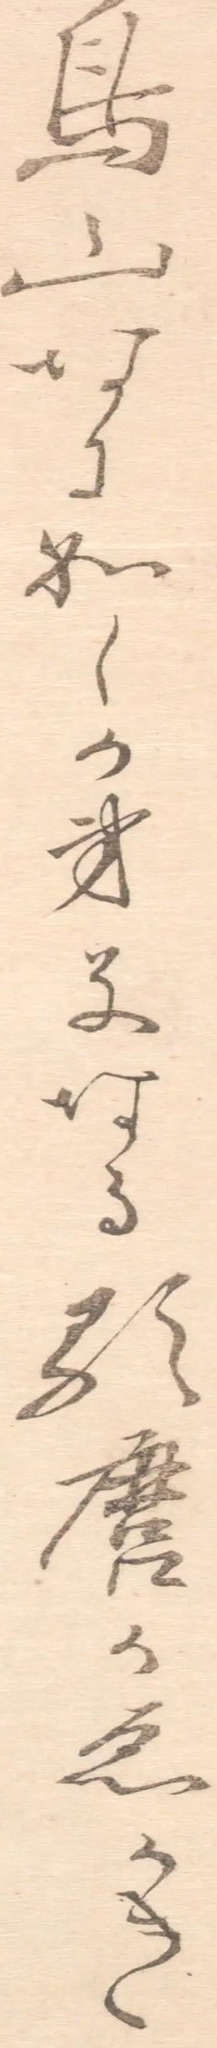鳥山なにかしか弟子なる歌麿かゑかき
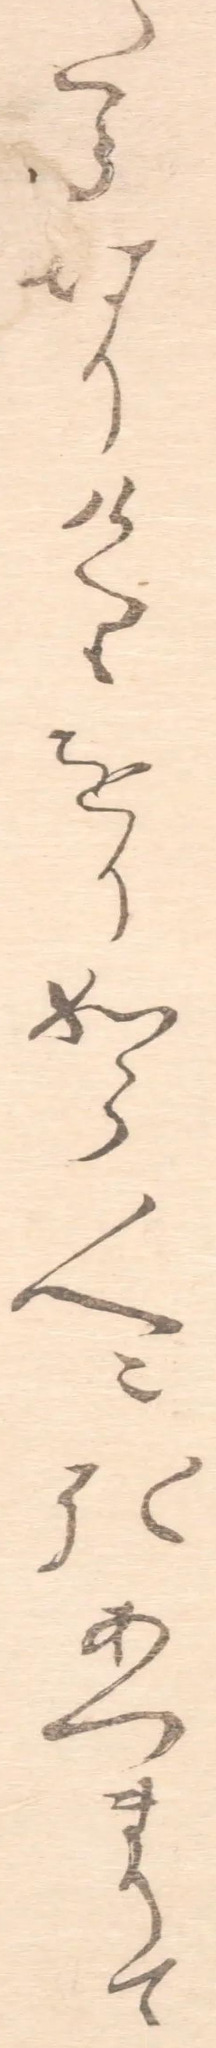たるなりけりをりから人々きあつまりて
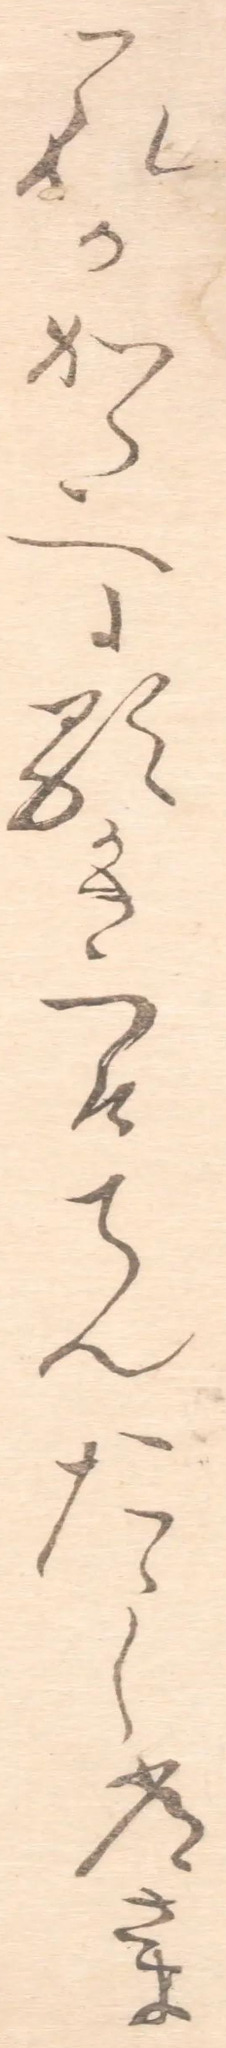これかかたへに歌かきつけてんたゝし常さま
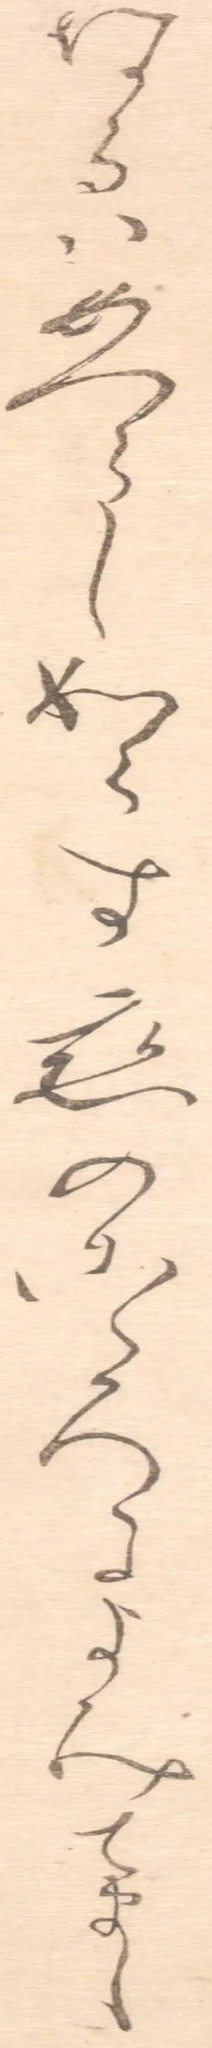なるはめつらしからす恋のこゝろによみてまし
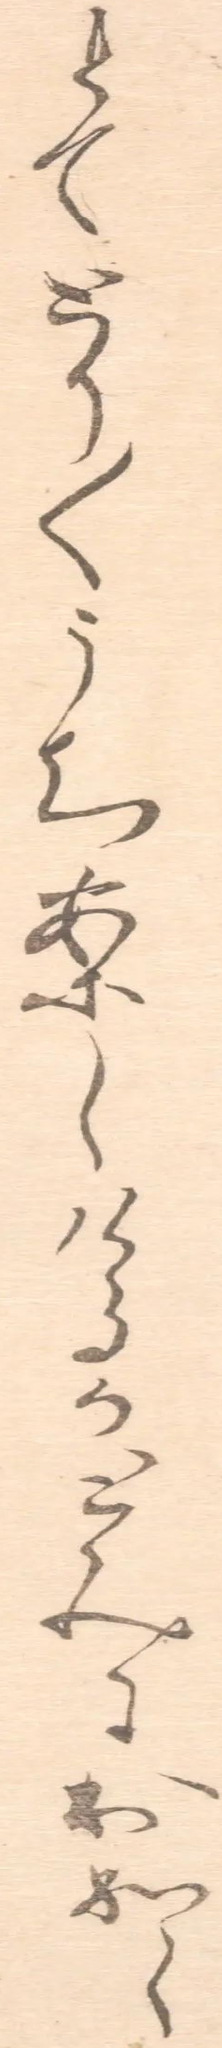とてとり〳〵うち案しけるかとみにおかし
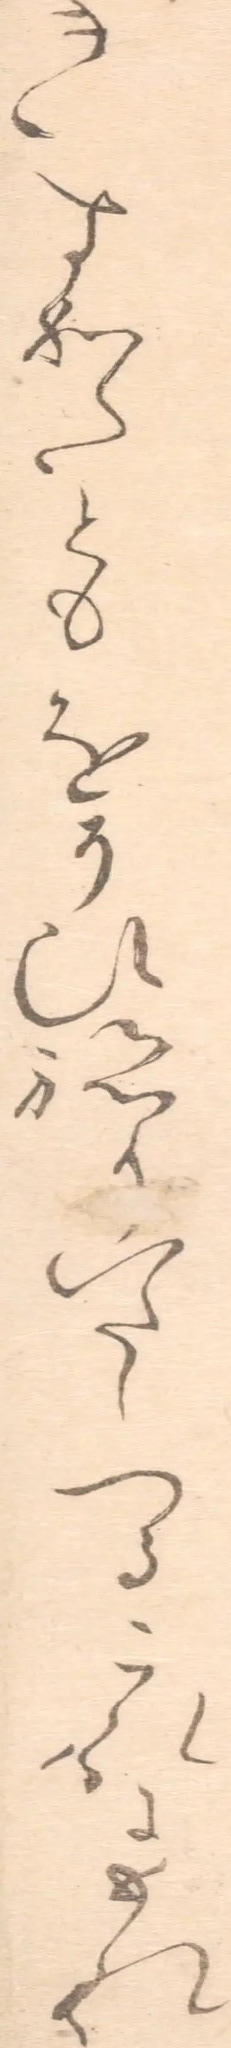きすかたともをそひねりいたしつるこれにもれ
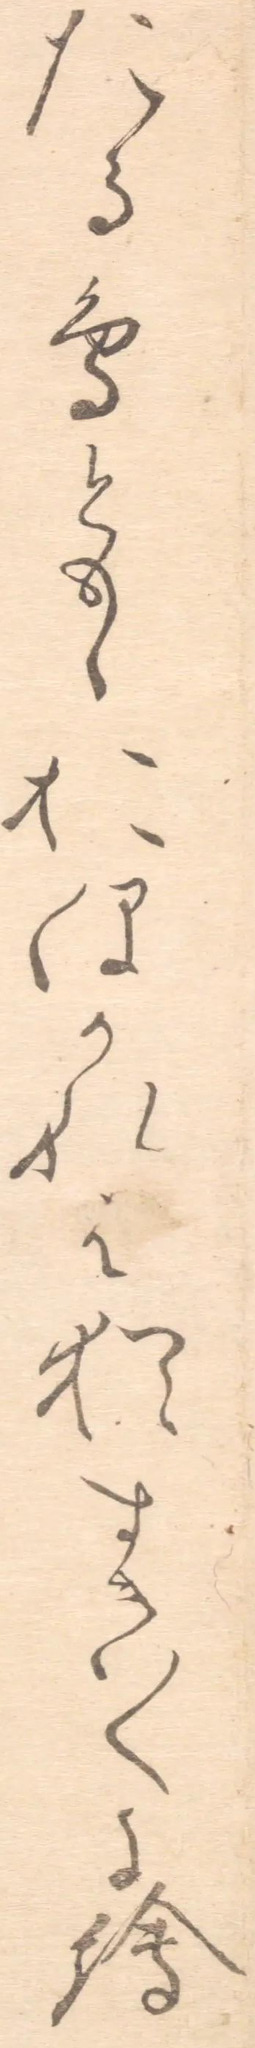たる鳥ともゝおほかれは猶すき〳〵に絵
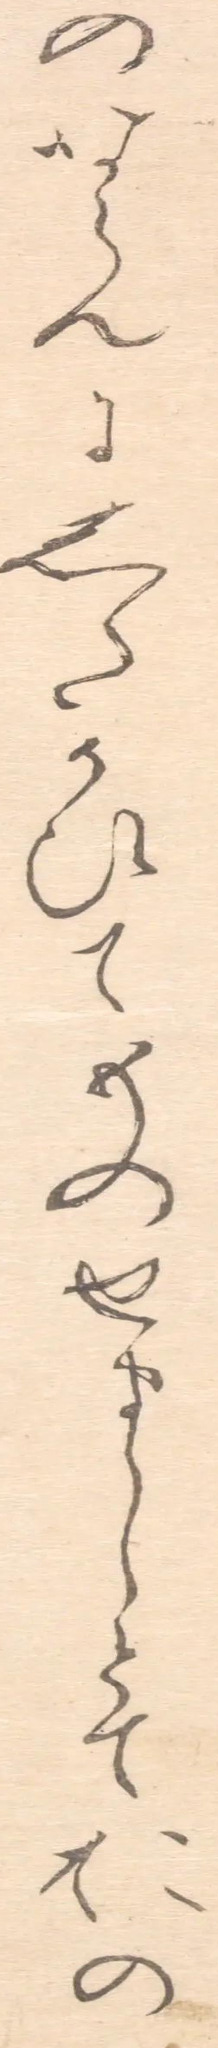のならんにしたかひてものせましとておの
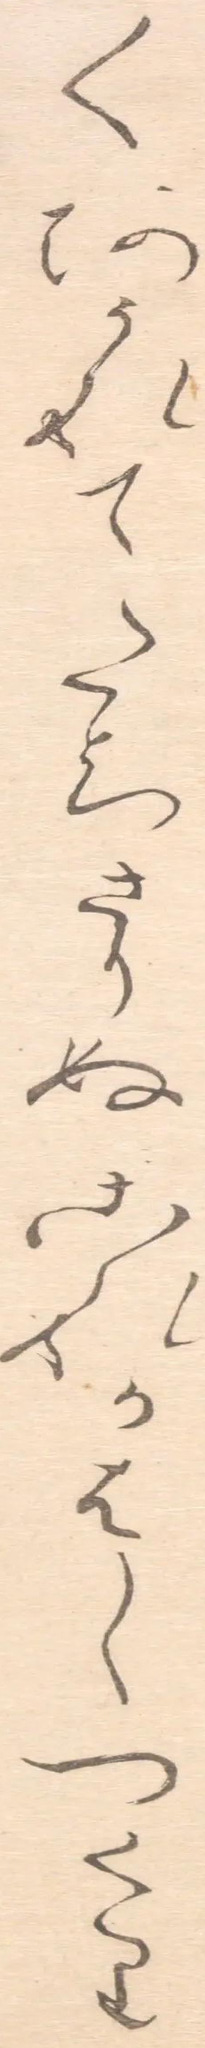〳〵あかれてたちさりぬこれかはしつくり
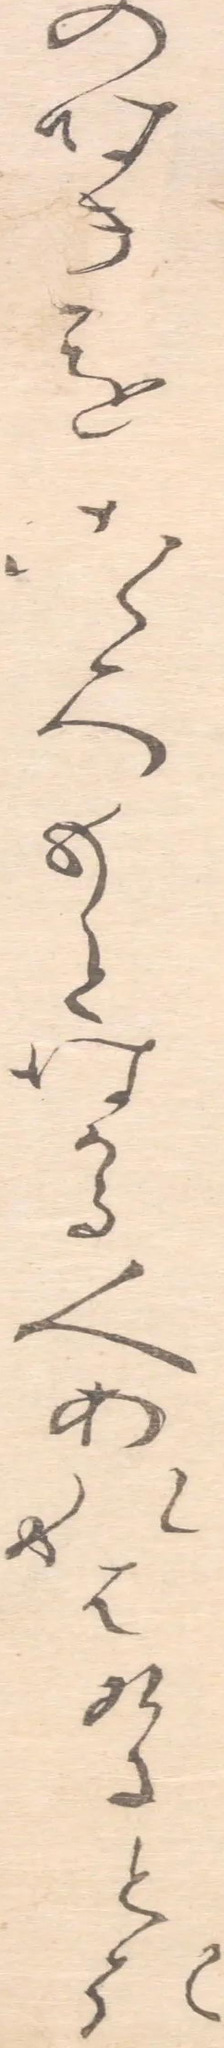のなきをこゝろもとなかる人あれはけにとき
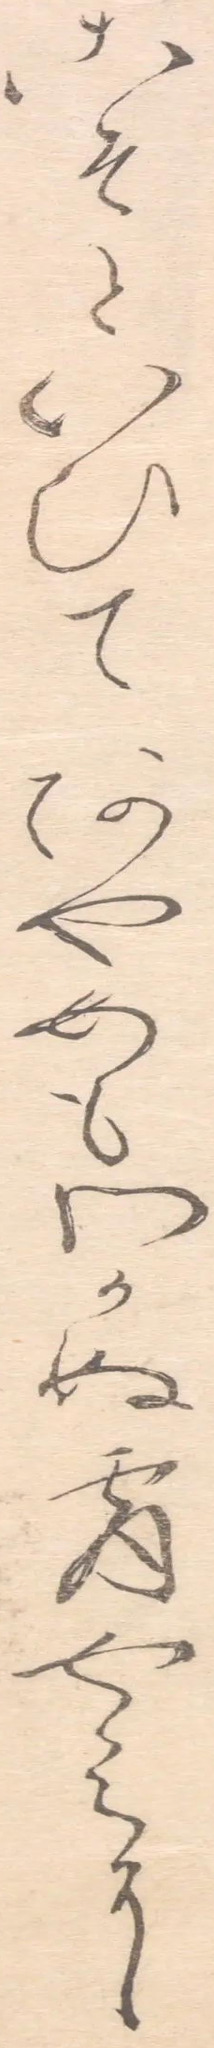こそといひてあやめもわかぬ宵やみに
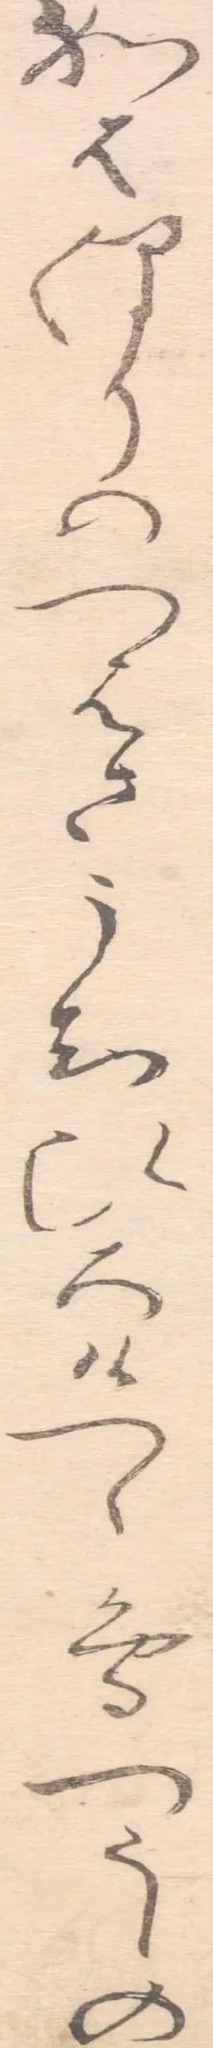かはほりのつはさうちひろけつゝ鳥つくしの
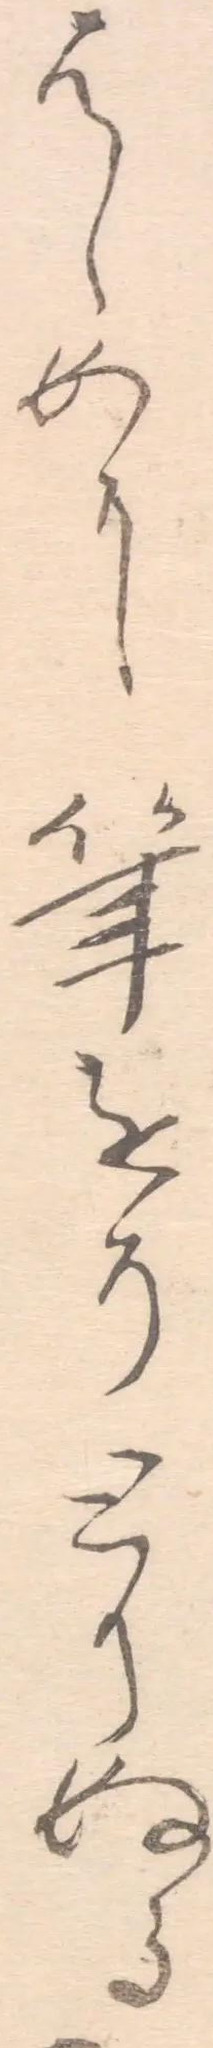はしめに筆をそとりぬる

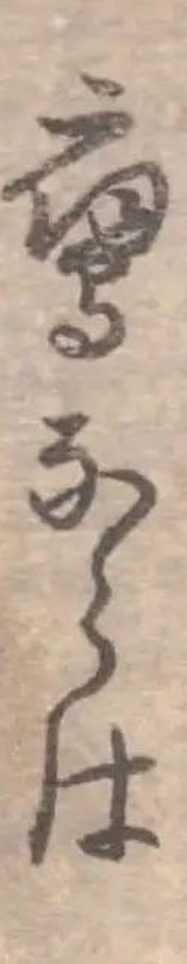鷹ならは
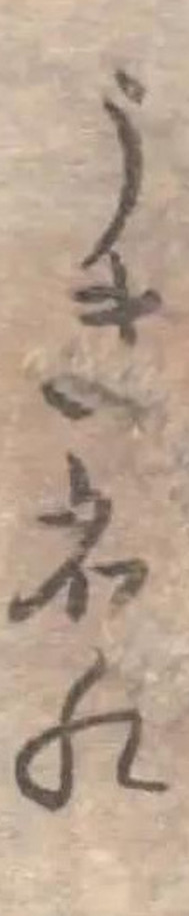うき名の
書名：絵本百千鳥. 1
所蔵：国立国会図書館 National Diet Library, JAPAN
